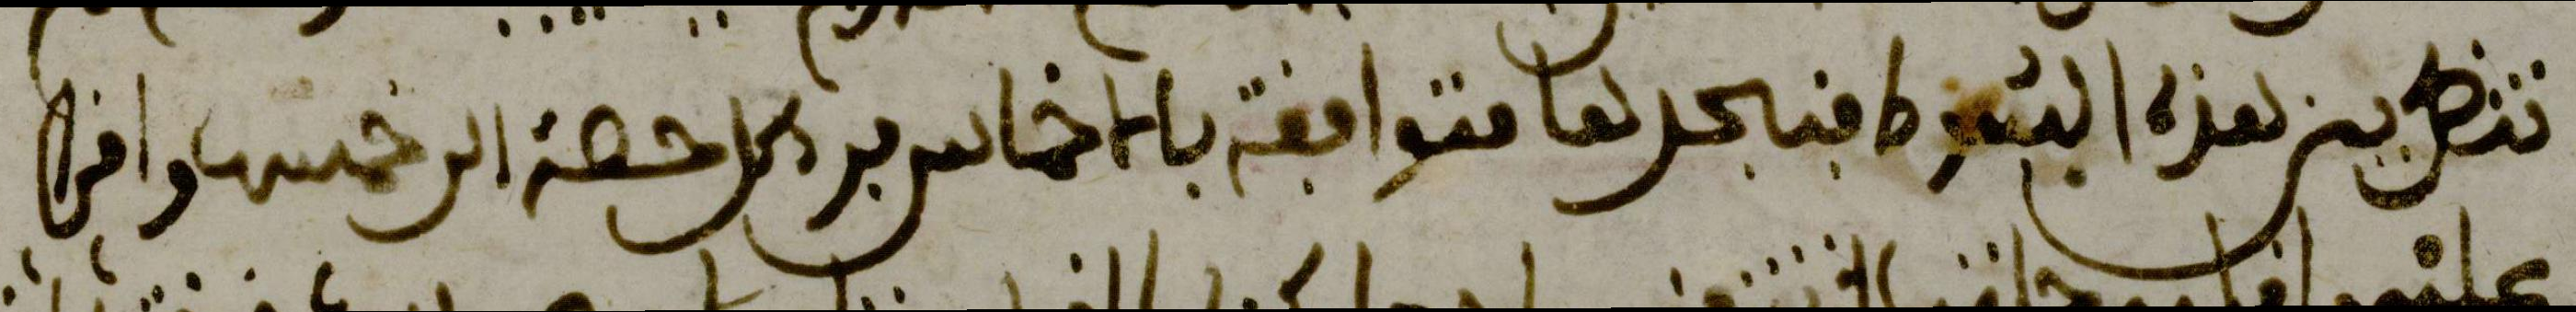تنظربين هذه البسوط فنجدها متوافقة بالاخماس فرد كل حصة الى خمسها و اقرا
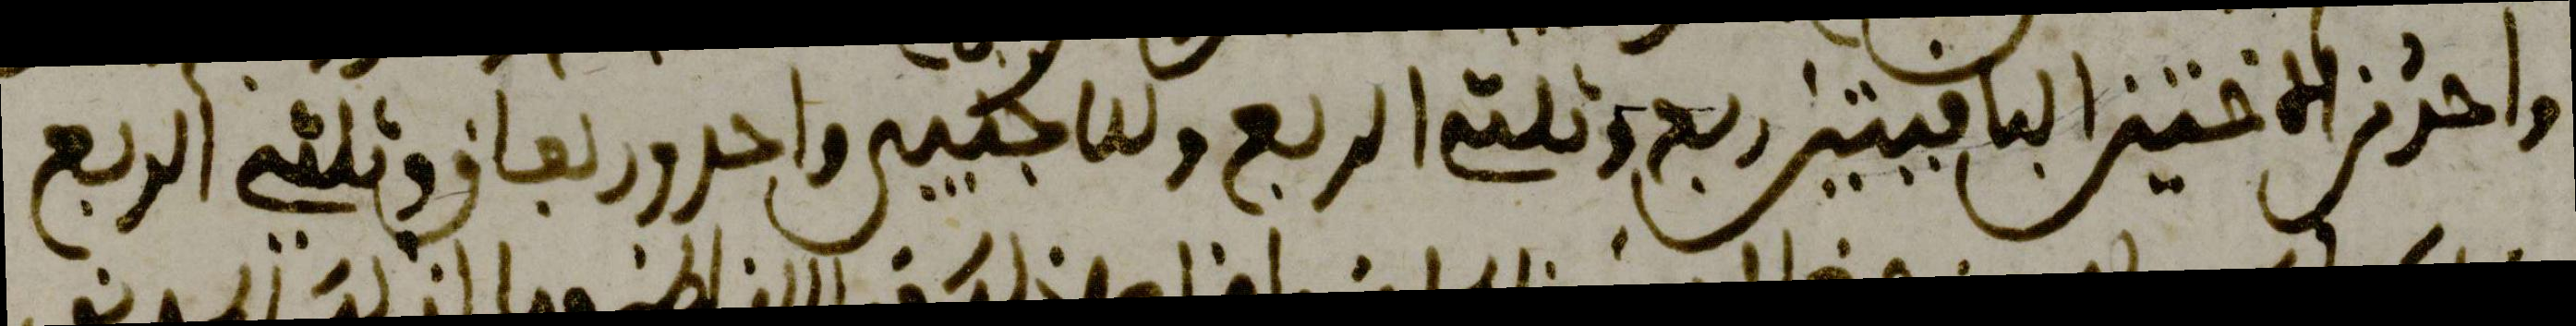واحد من الاختين الباقيتين ربع وثلثى والربع وللاجنبي واحد وربعان وثلثي الربع
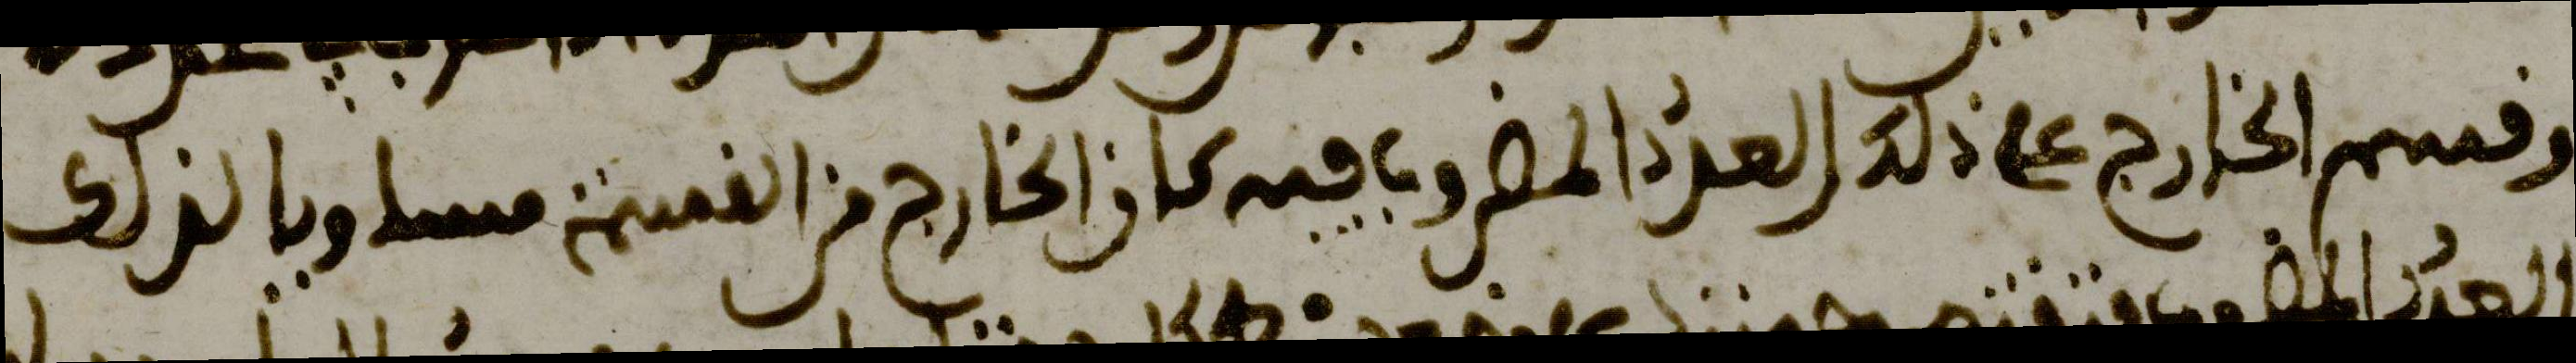وقسم الخارج على ذلك العدد المضروب فيه كان الخارج من القسمة مساويا لذلك
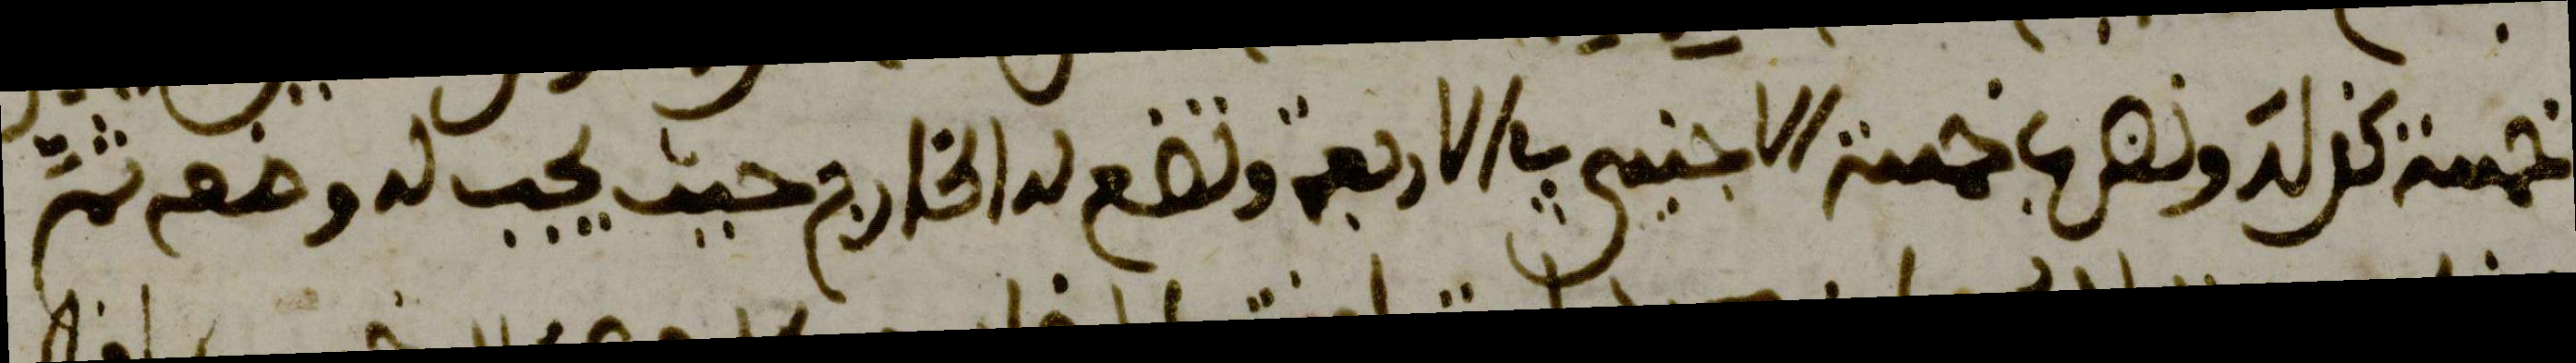خمسة كذلك ونضرب خمسة الا جنبى في الاربعة وتضع له الخارج حيث يجب له وضعه ثم
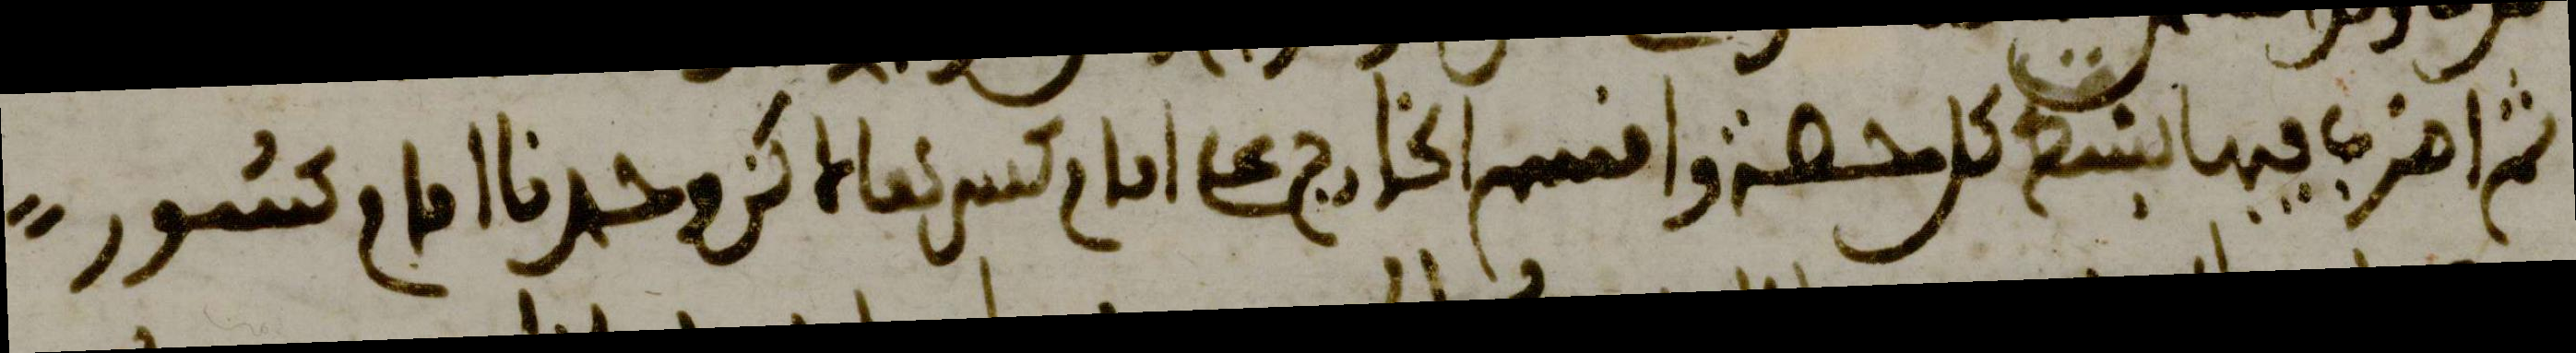ثم اضرب فيها بسط كل حصة واقسم الخارج على امام كسر ها لاكن وحدما امام كشور
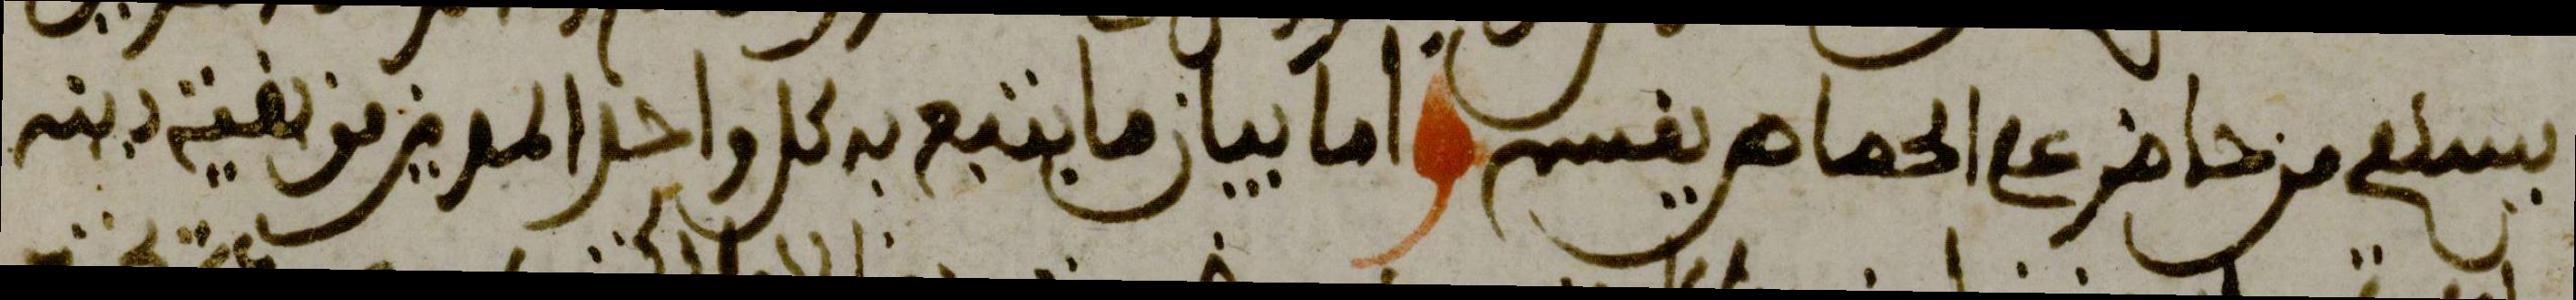يسهم من حاضر على الحصاص يقسم اما بيان ما يتبع به كل واحد المدين من بقية دينه
